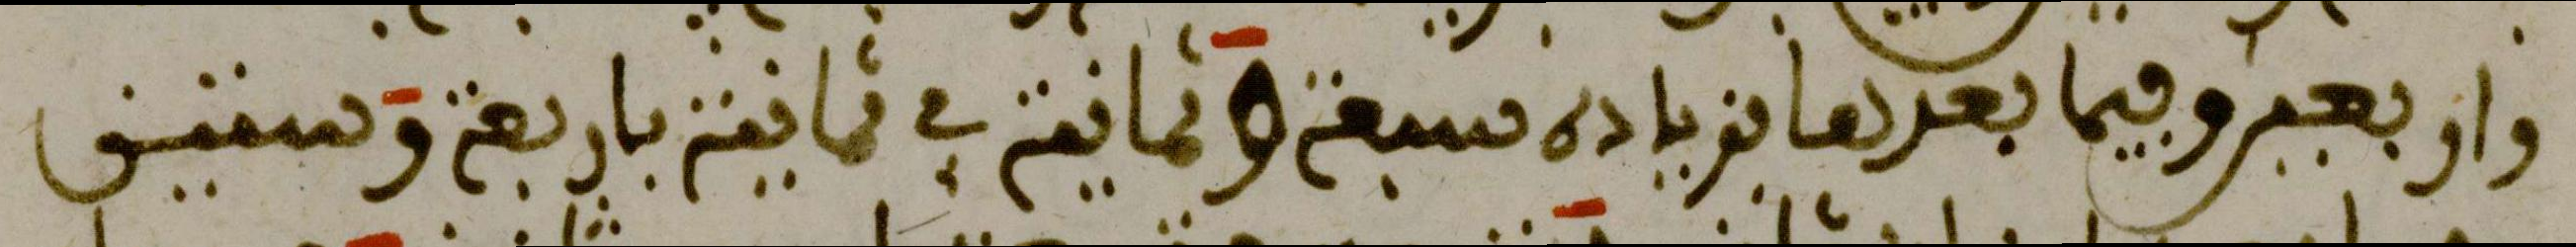و اربعين و فيما بعدها بزيادة سبعة عة و ثمانية في ثمانية باربعة و ستين
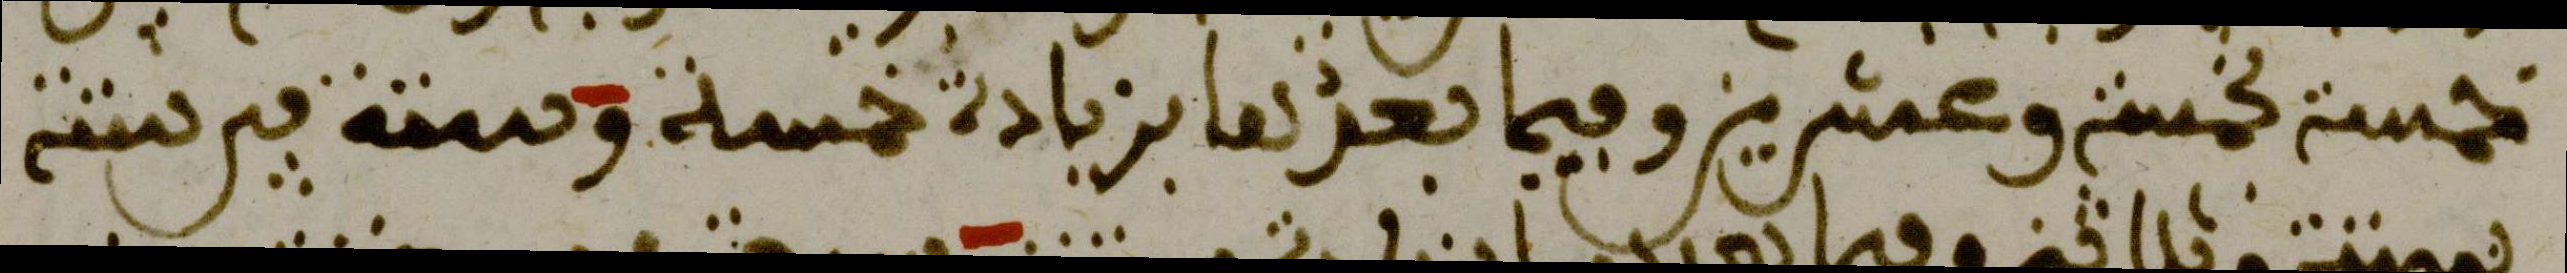خمسة بخمسة و عشرين و فيما بعدها بزيادة خمسة و ستة في ستة
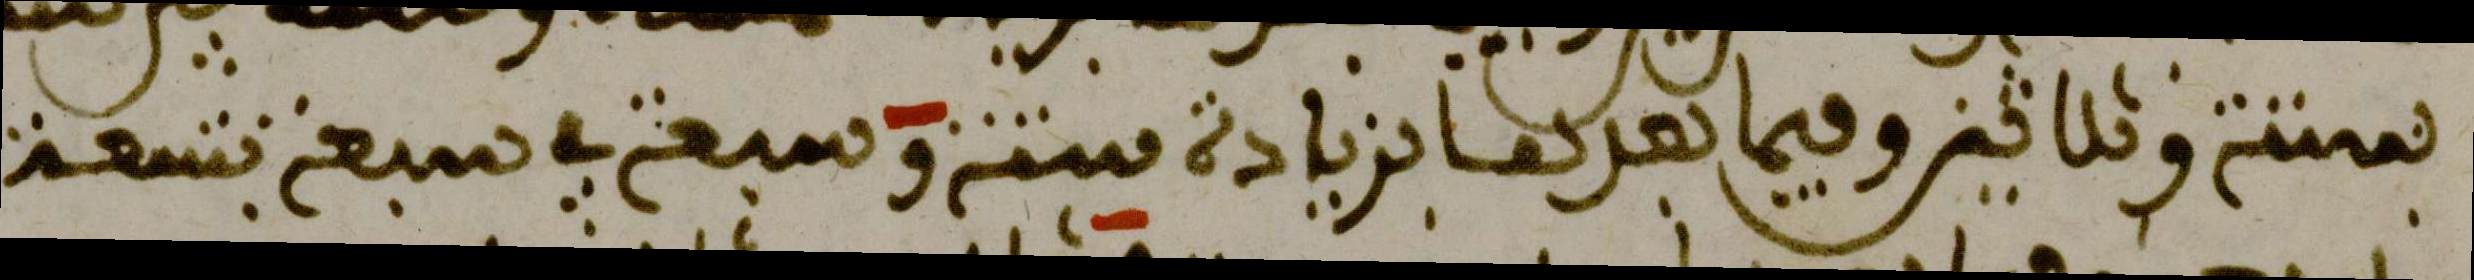بستة و ثلاثين و فيما بعدها بزيادة ستة و سبعة في سبعة تسعة
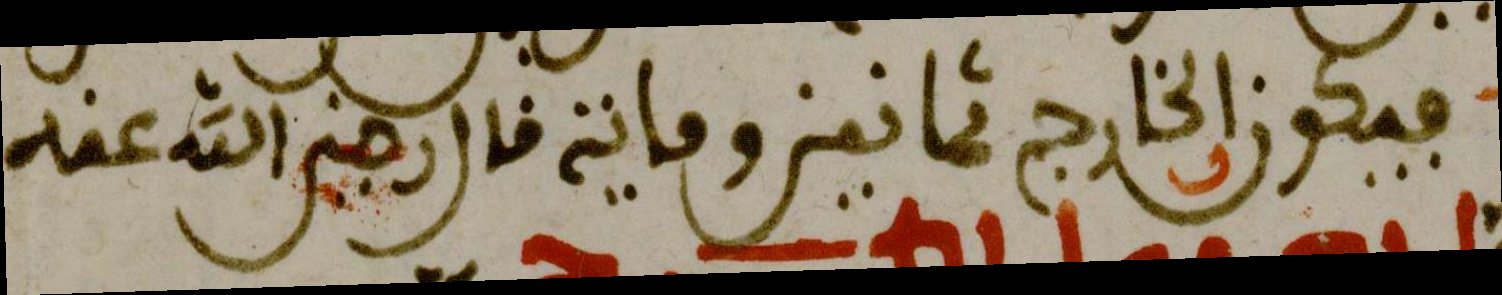فيكون الخارج ثمانين و ماية قال رضي الله عنه
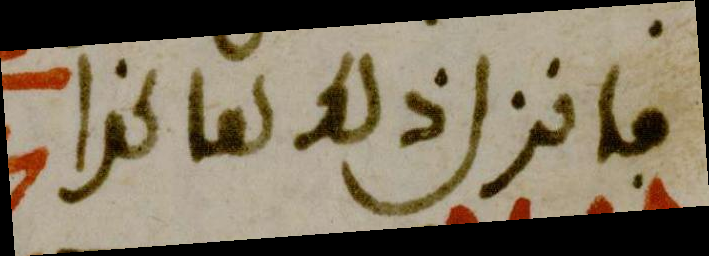فانزل ذلك هاكذا
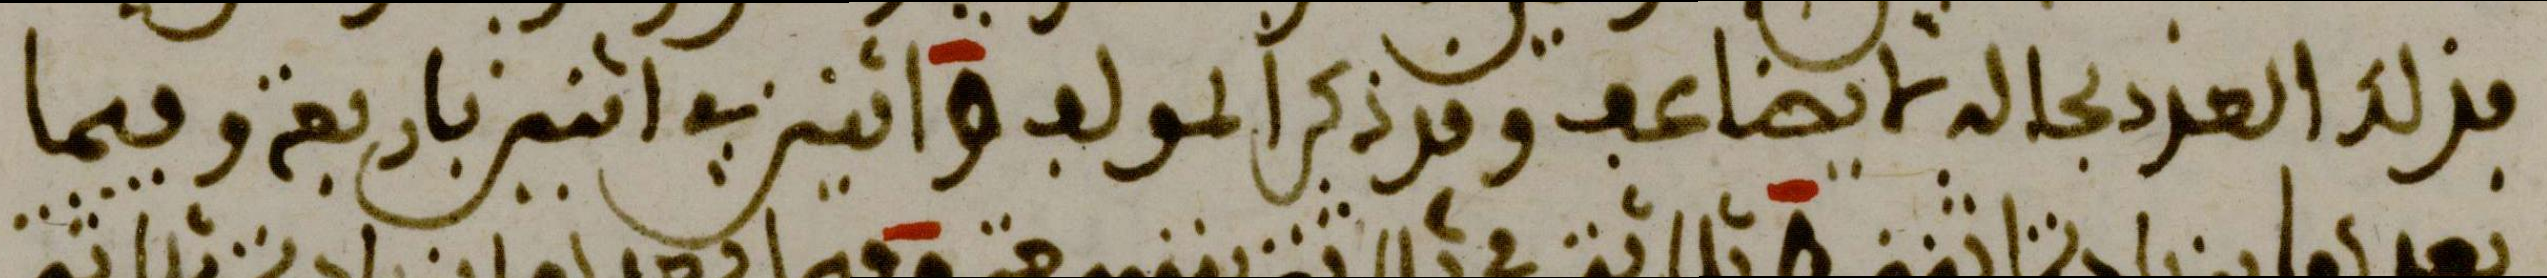فذلك العدد بحاله لا يضاعف و قد ذكر المولف و اثنين في اثنين باربعة و فيما
